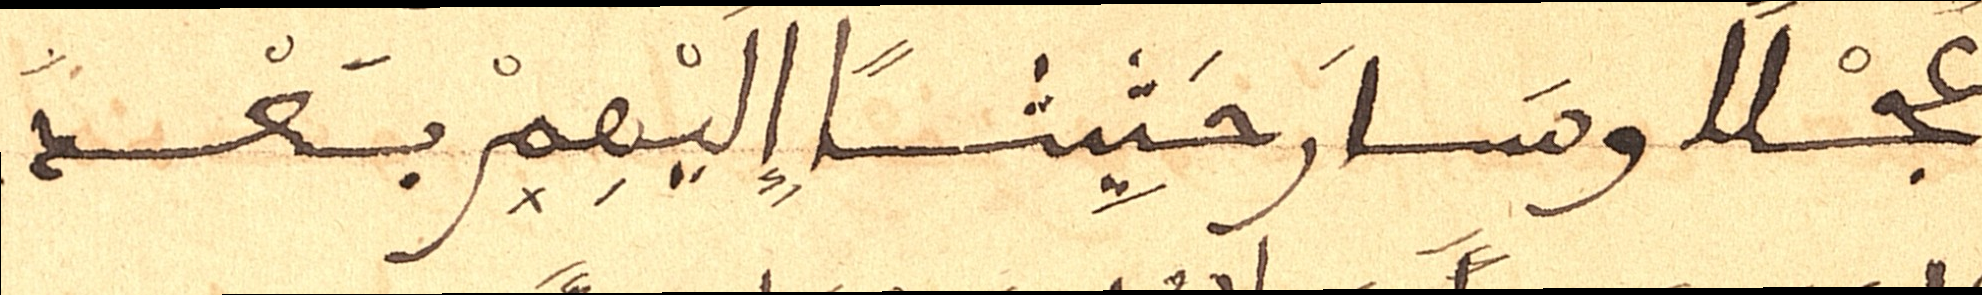عجلا وسار حثيثا اليهم بعد
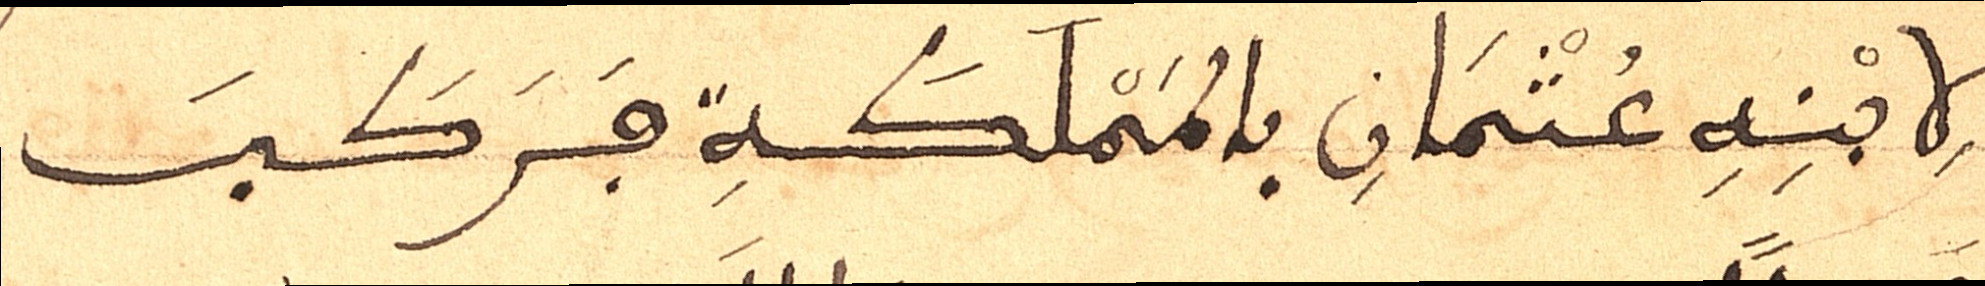لابنه عثمان بالمملكة فركب
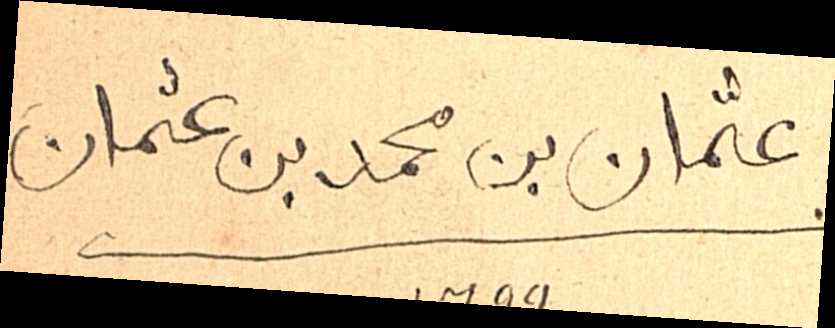عثمان بن محمد بن عثمان
